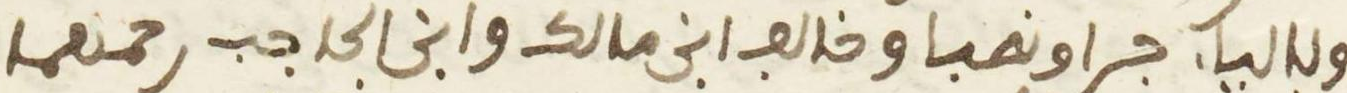وبالياء جرا ونصبا وخالف ابن مالك وابن الحاجب رحمهما
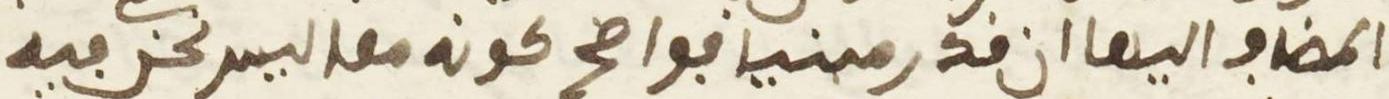المضاف اليها ان قدر مبنيا فواضح كونه معا ليس نخر فيه
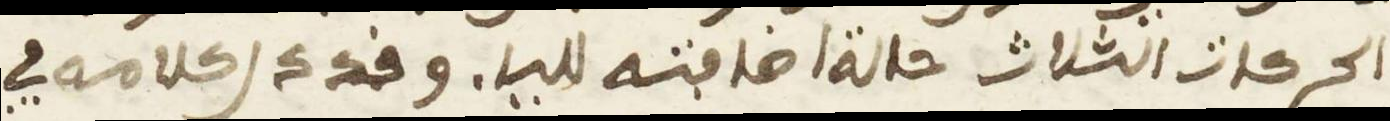الحركات الثلاث حالة اضافته للياء وقد دل كلامه في
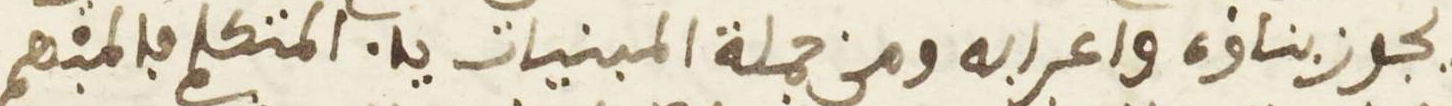يجوز بناؤه واعرابه ومن جملة المبنيات ياء المتكلم فالمبهم
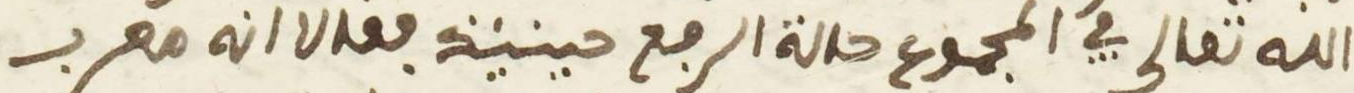الله تعالى في المجموع حالة الرفع حينئذ فقالا انه معرب
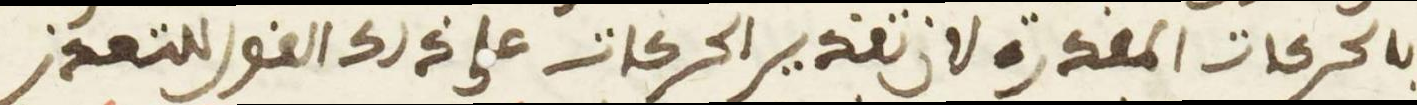بالحركات المقدرة لان تقدير الحركات على ذلك القول للتعذر
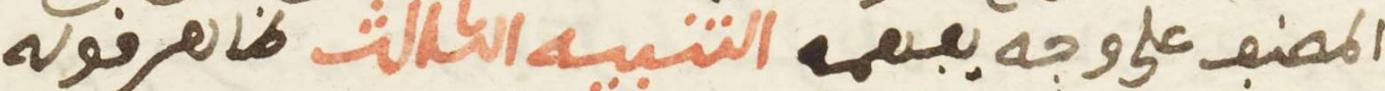المصنف على وجه يفهمه التنبيه الثالث ظاهر قوله
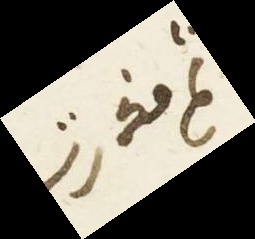ثم قدرت
